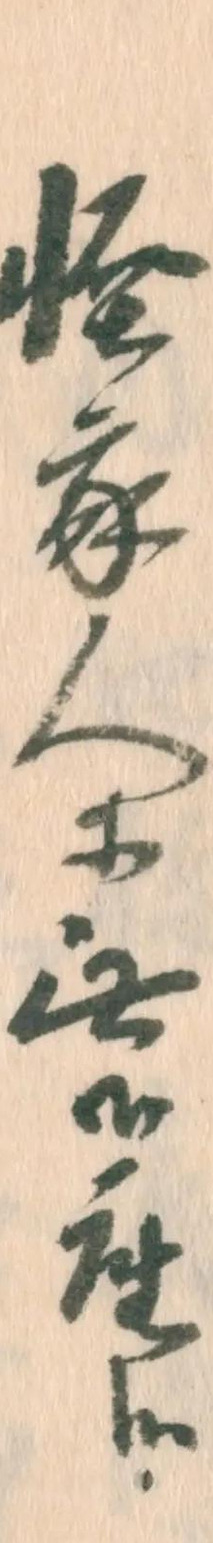一怪我人等無御座候
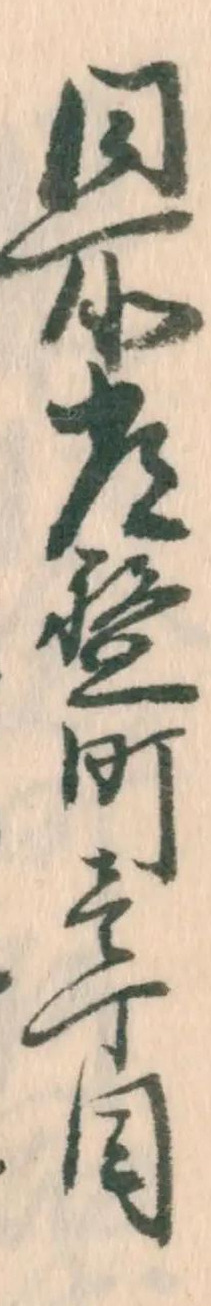同所常盤町壱丁目
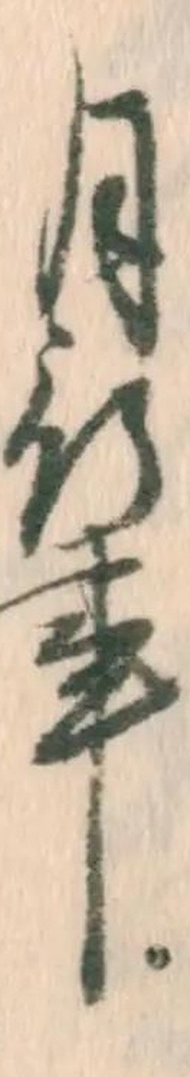月行事
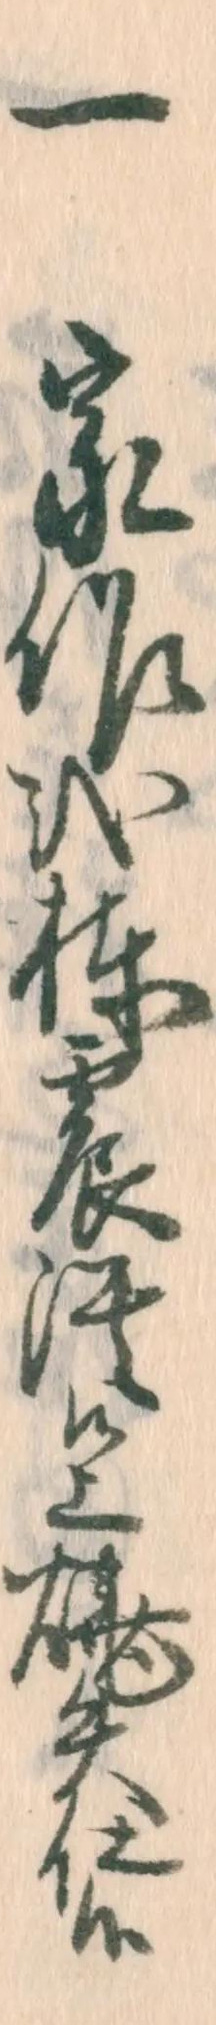一家作弐棟震潰候上焼失仕候
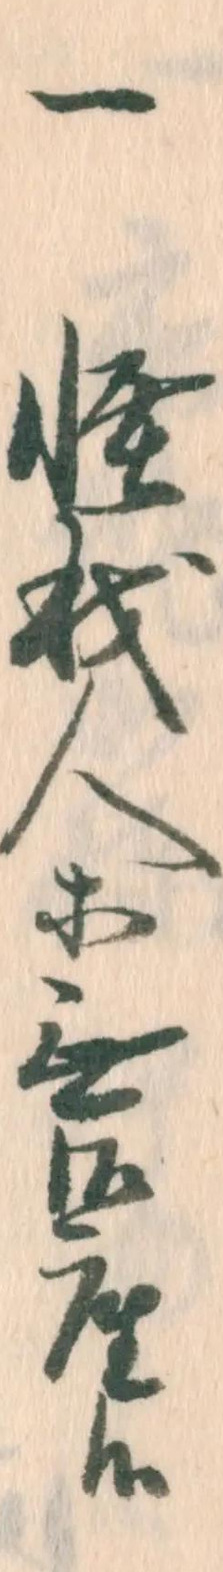一怪我人等無御座候
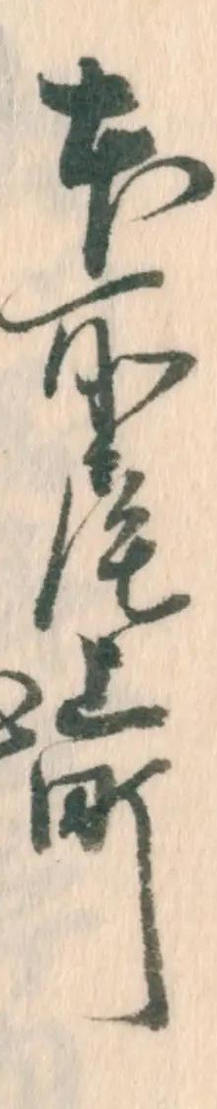本所尾上町

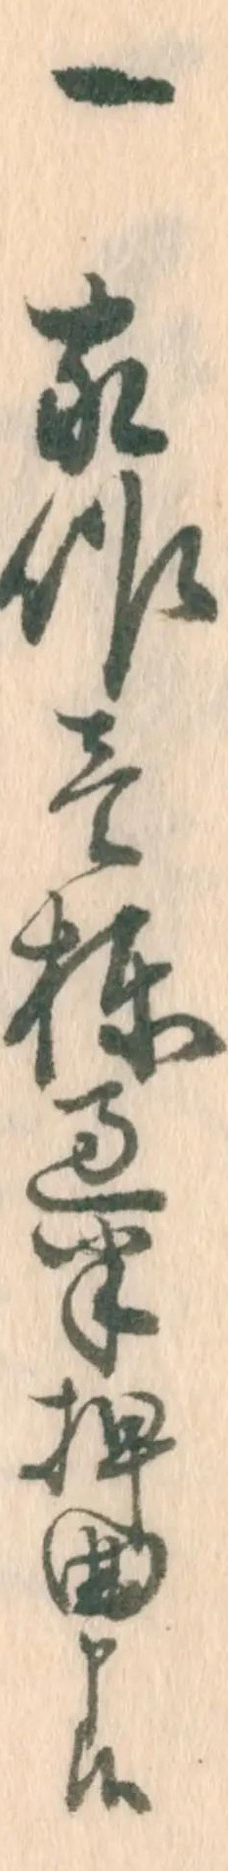一家作壱棟過半押曲申候
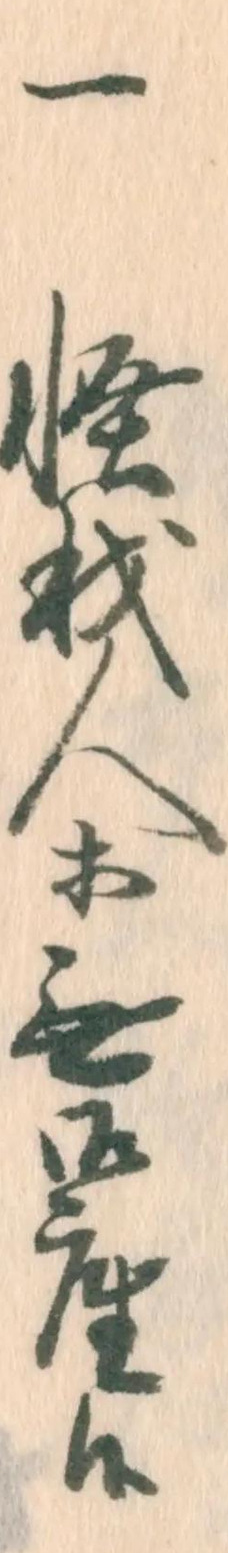一怪我人等無御座候
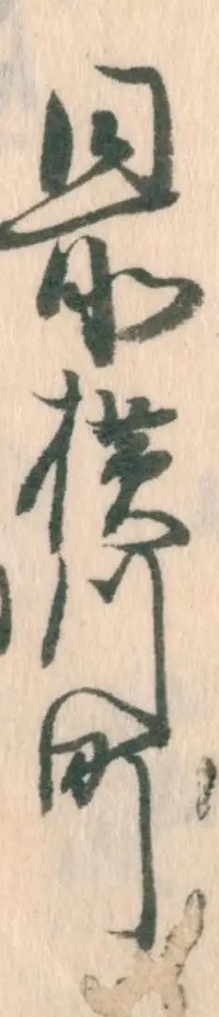同所横川町
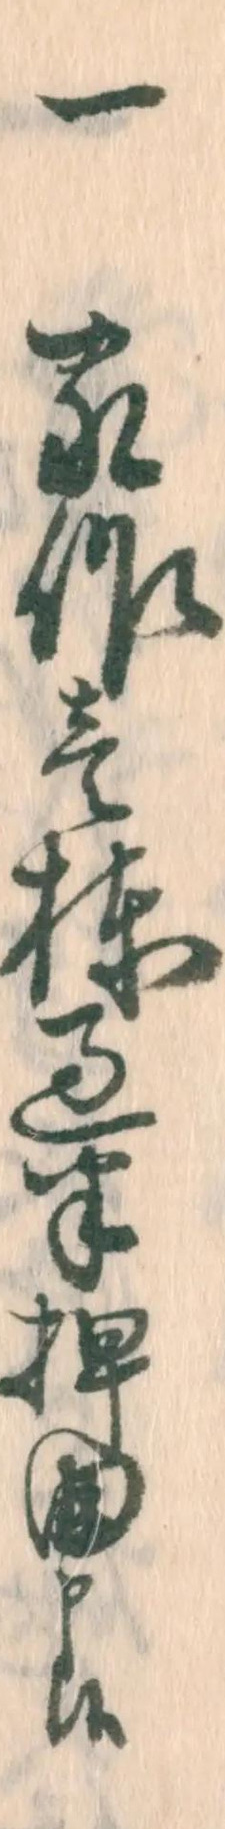一家作壱棟過半押曲申候
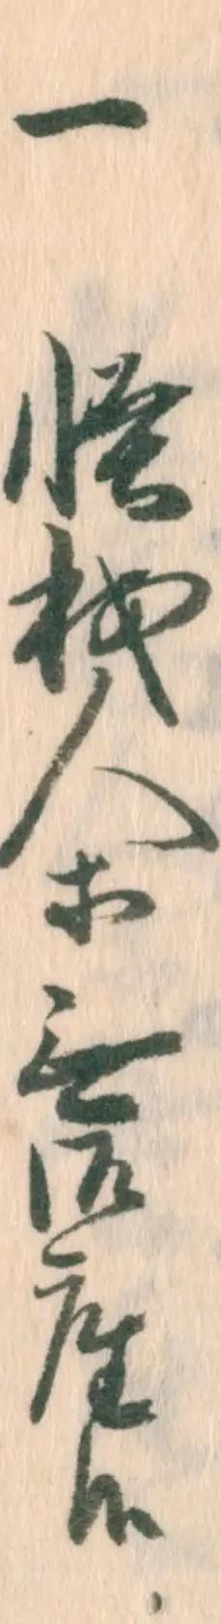一怪我人等無御座候
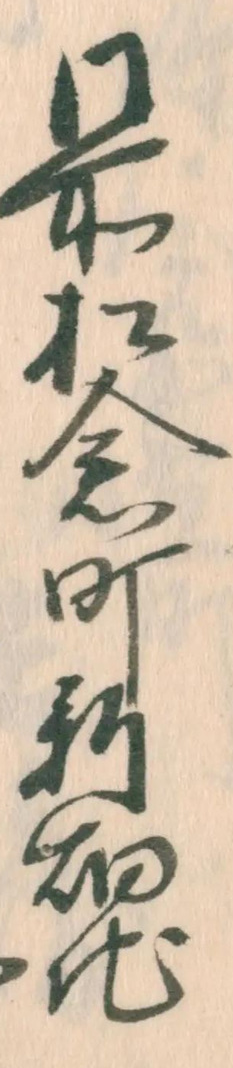同所松倉町新畑地
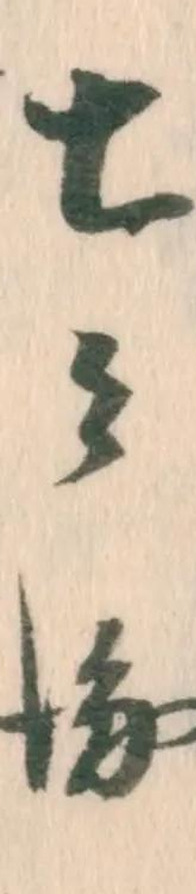七兵衛
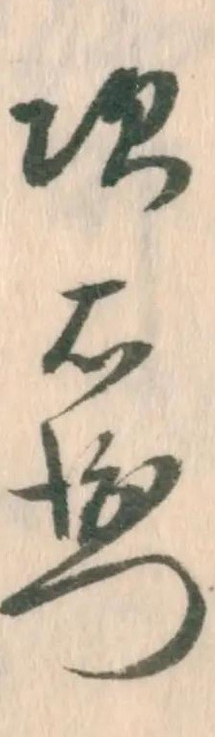次右衛門
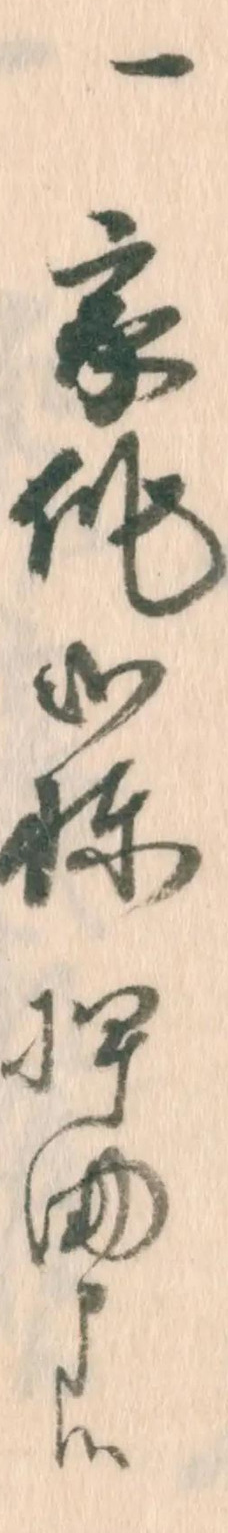一家作弐棟押曲申候
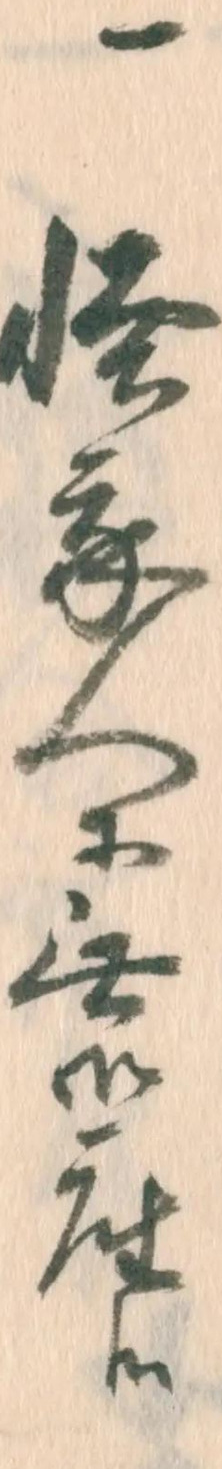一怪我人等無御座候
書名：地震災書留 2巻. [1] 内表紙に「地震災書留　安政二卯年　但本所深川御用屋敷地代免除調」とあり
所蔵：国立国会図書館 National Diet Library, JAPAN
